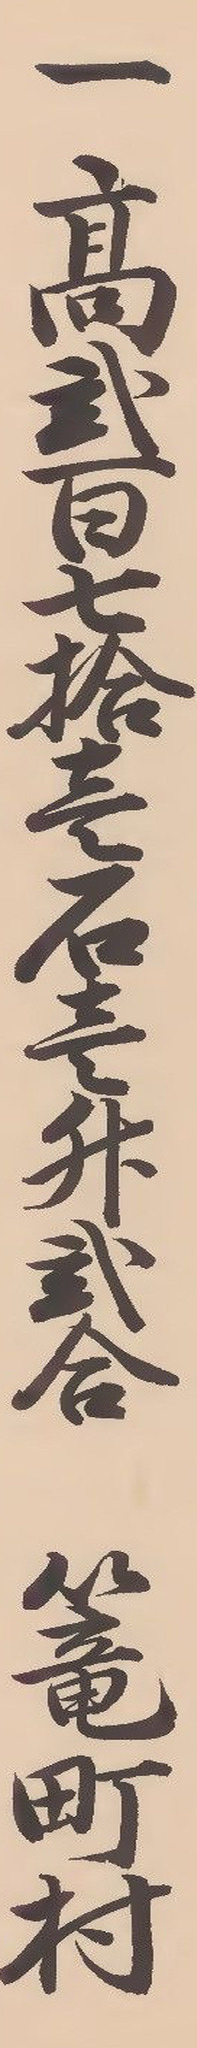一高弐百七拾壱石壱升弐合篭町村
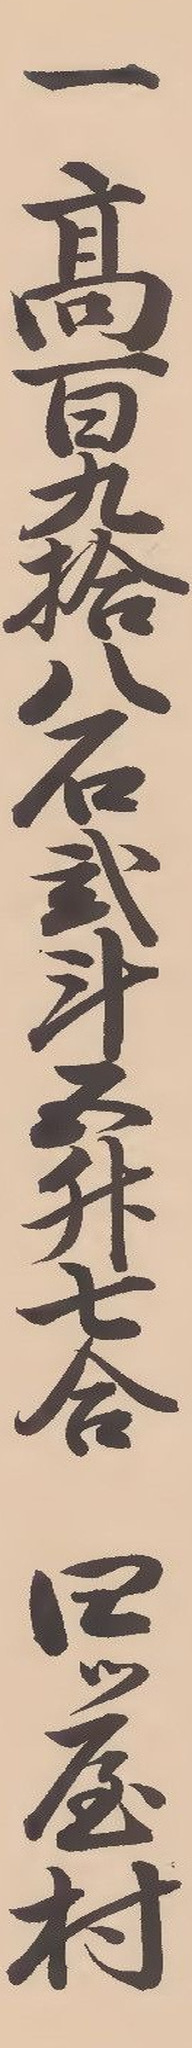一高百九拾八石弐斗五升七合四ツ屋村
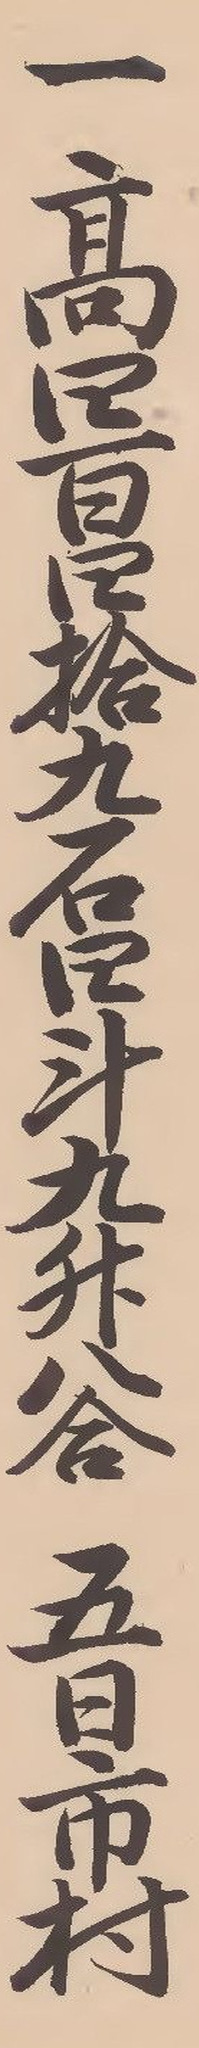一高四百四拾九石四斗九升八合五日市村
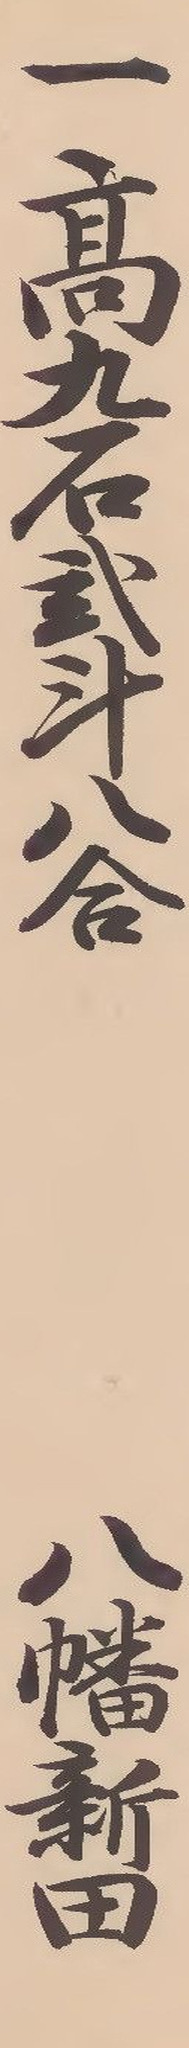一高九石弐斗八合八幡新田
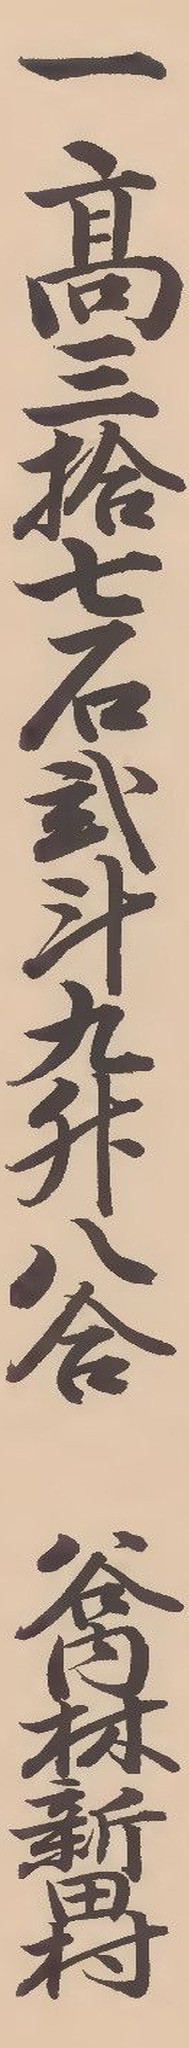一高三拾七石弐斗九升八合谷内林新田村

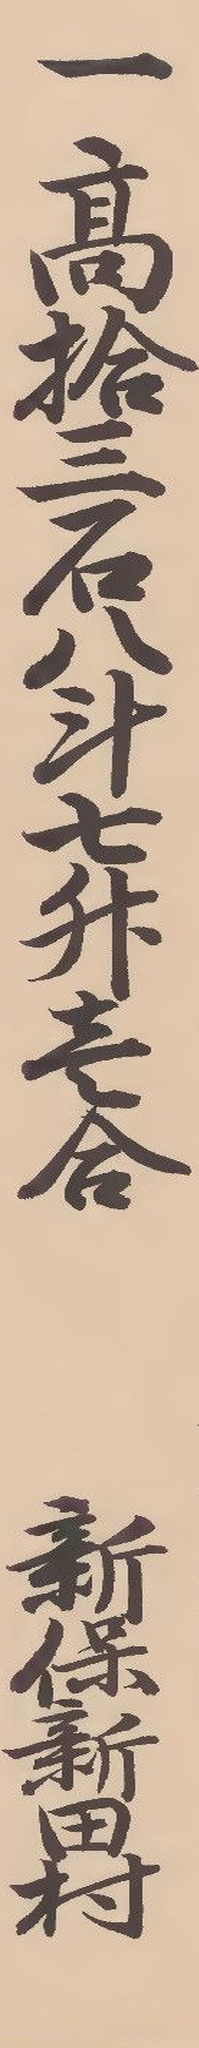一高拾三石八斗七升壱合新保新田村
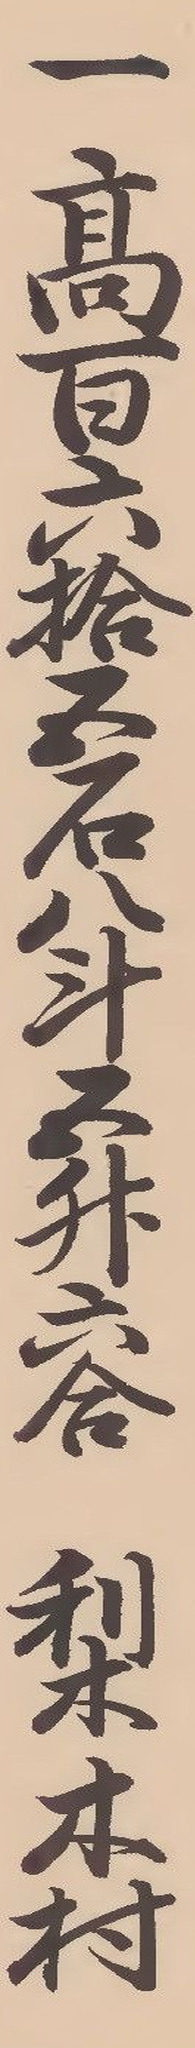一高百六拾五石八斗五升六合梨木村
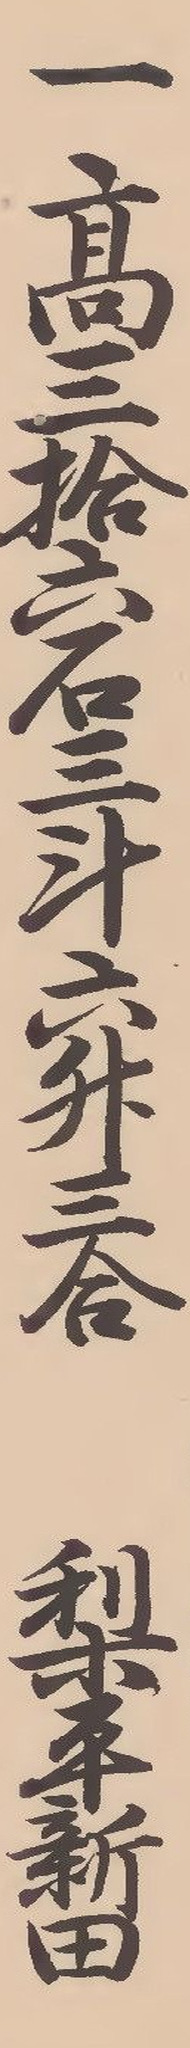一高三拾六石三斗六升三合梨平新田
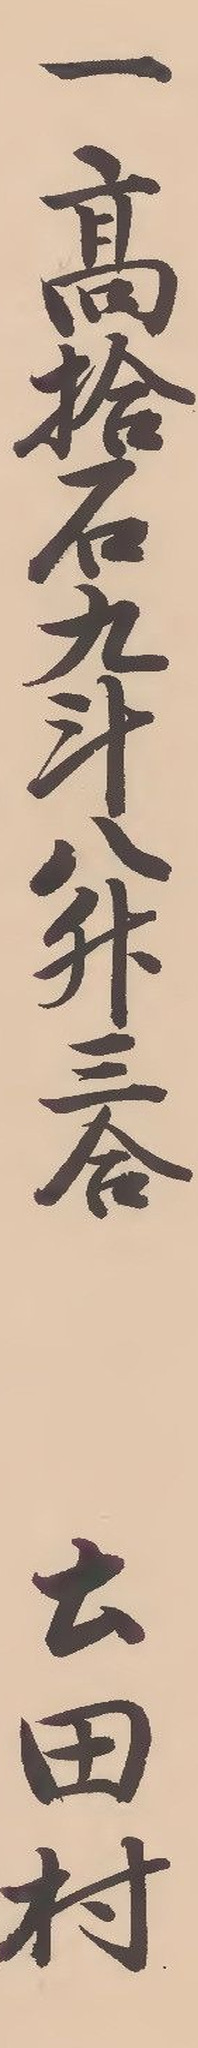一高拾石九斗八升三合土田村
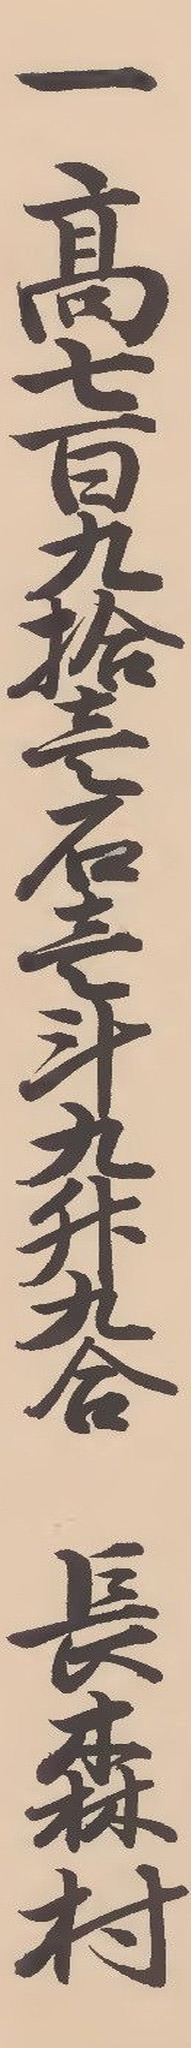一高七百九拾壱石壱斗九升九合長森村
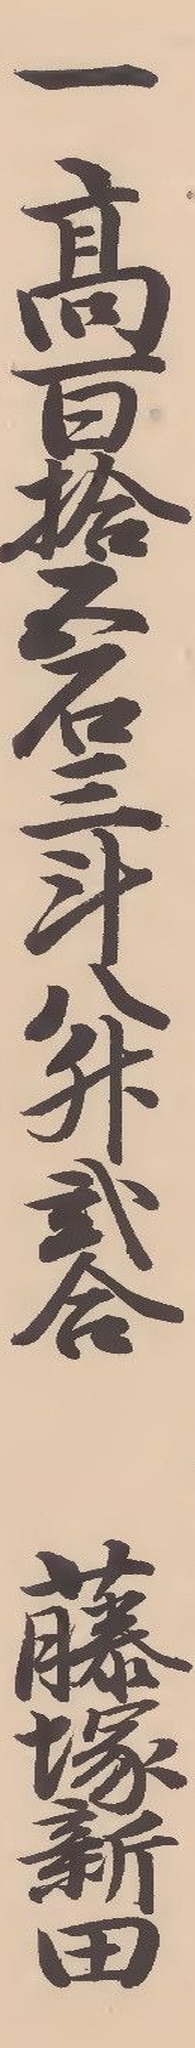一高百拾五石三斗八升弐合藤塚新田
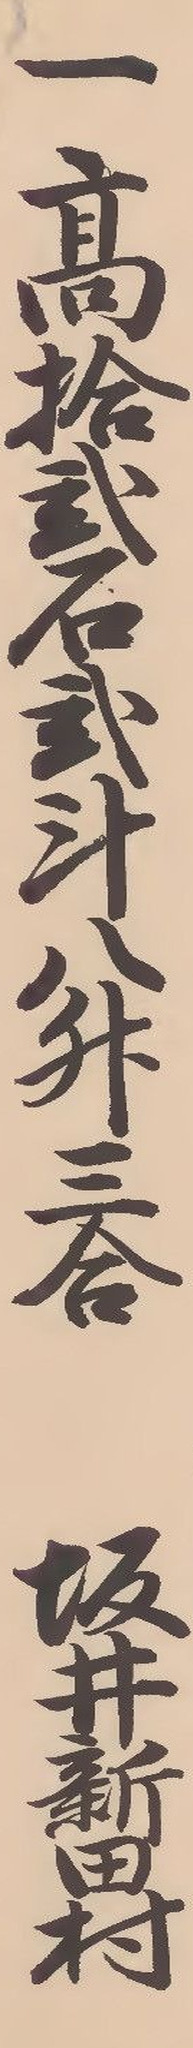一高拾弐石弐斗八升三合坂井新田村
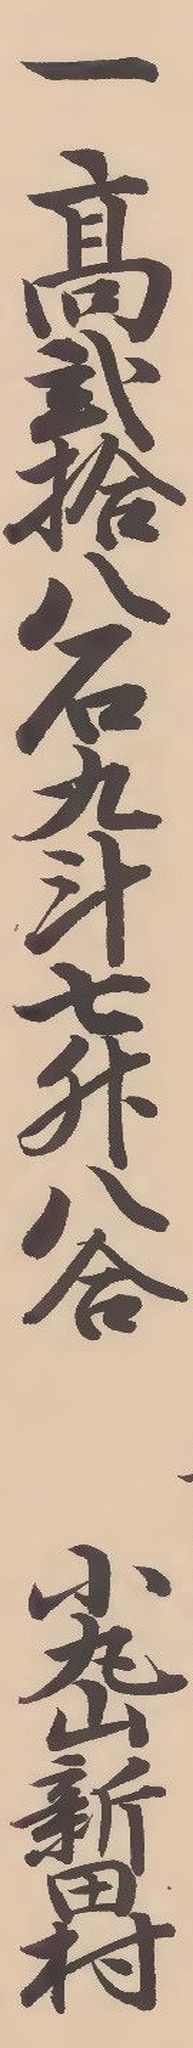一高弐拾八石九斗七升八合小丸山新田村

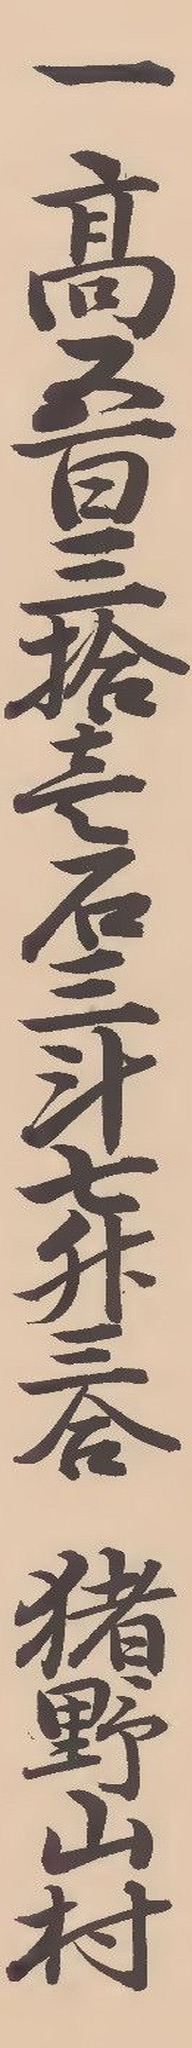一高五百三拾壱石三斗七升三合猪野山村
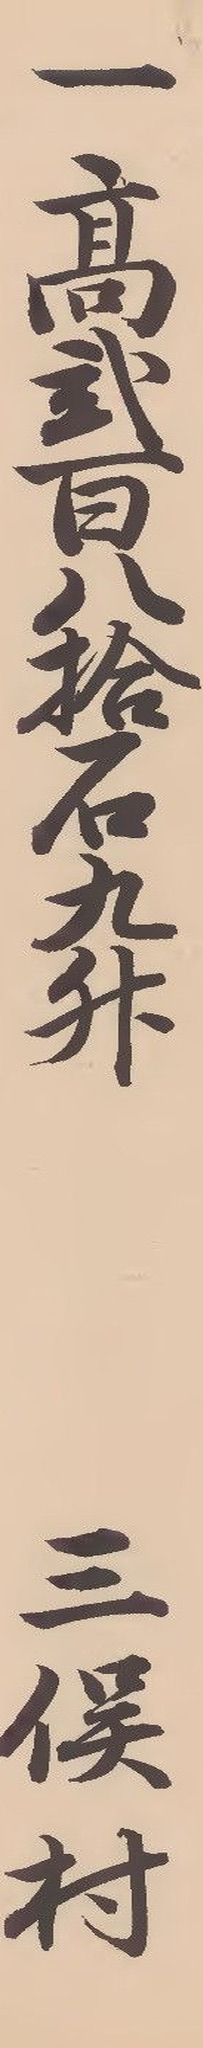一高弐百八拾石九升三俣村
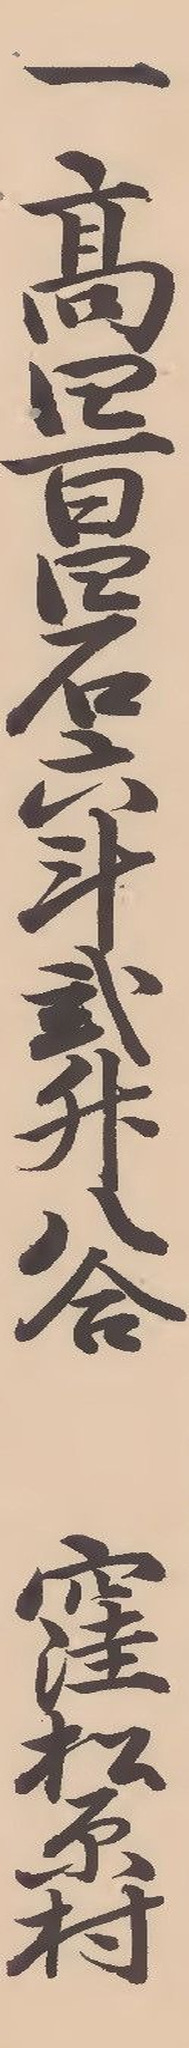一高四百四石六斗弐升八合窪松原村
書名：越後国郷帳　上
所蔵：国立公文書館 National Archives of Japan
